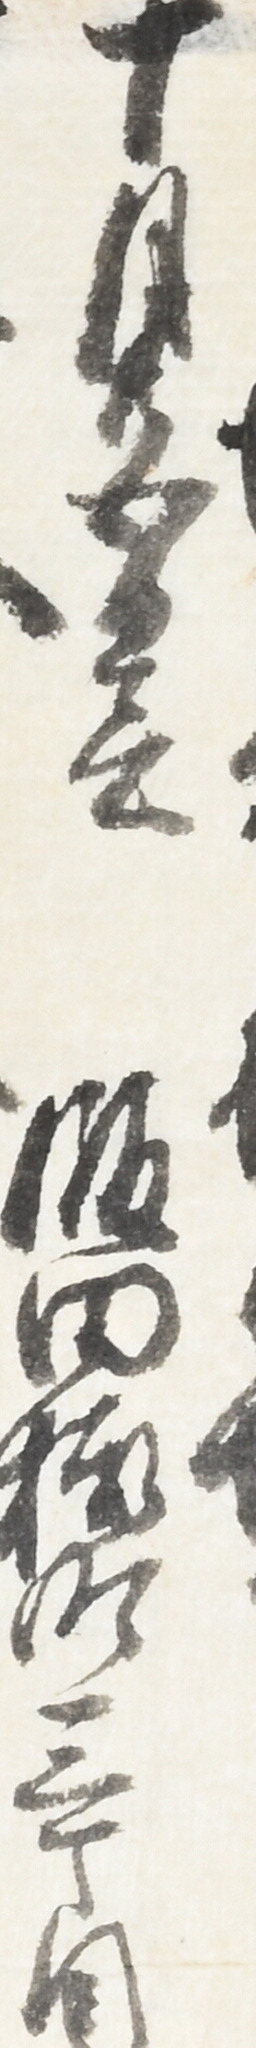十月廿五日着飯田桜町三丁目
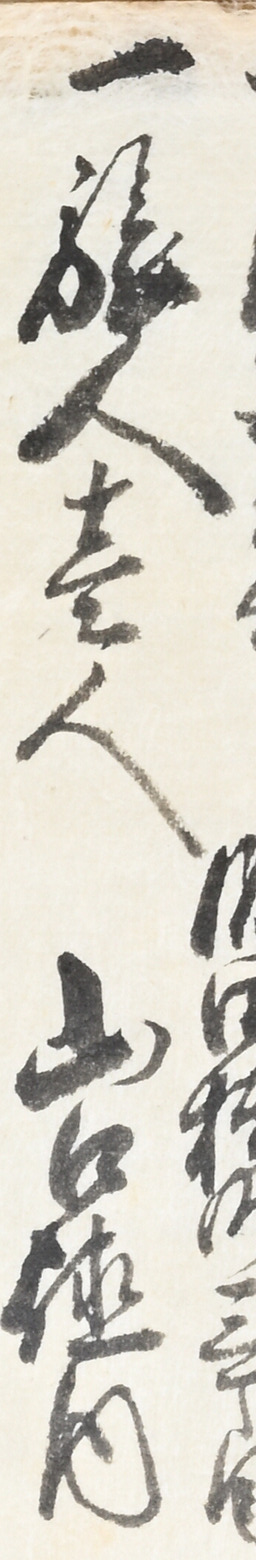一旅人壱人山口徳内
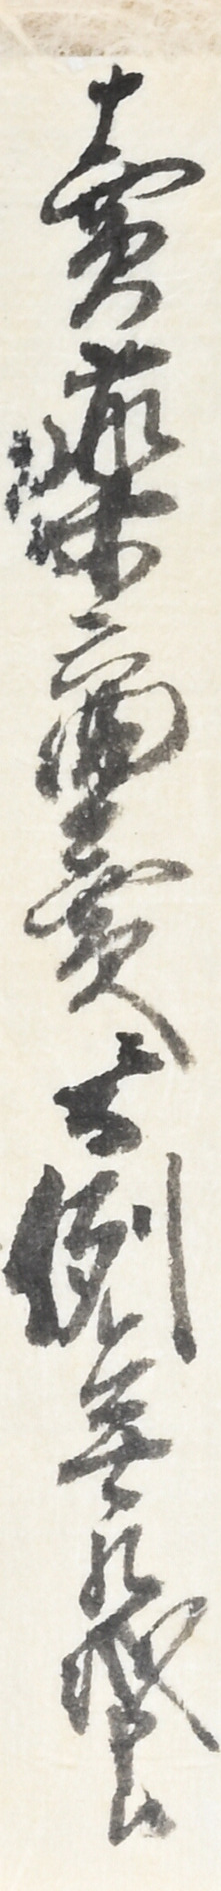売薬商売ニ而例年罷越申候
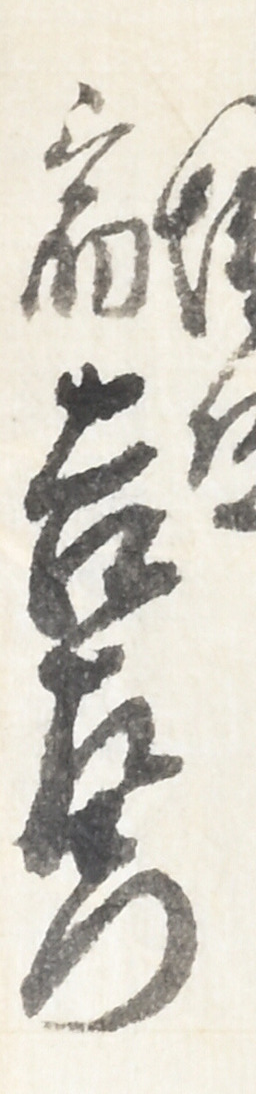宿吉左衛門

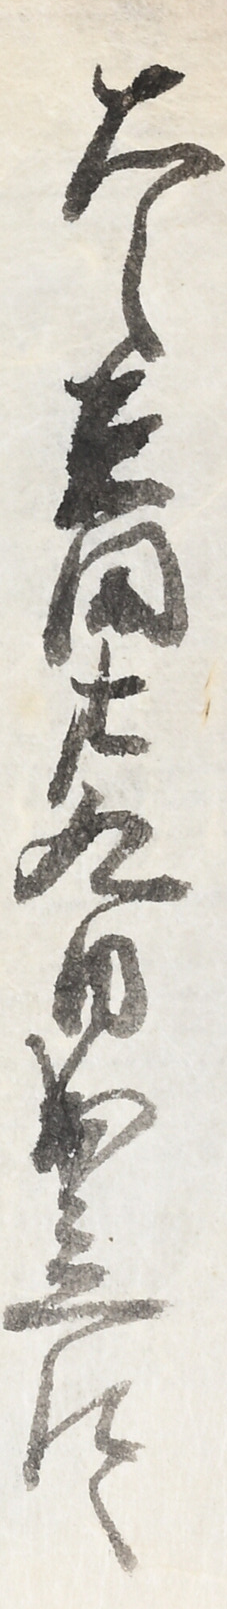右之者同廿九日出立仕候
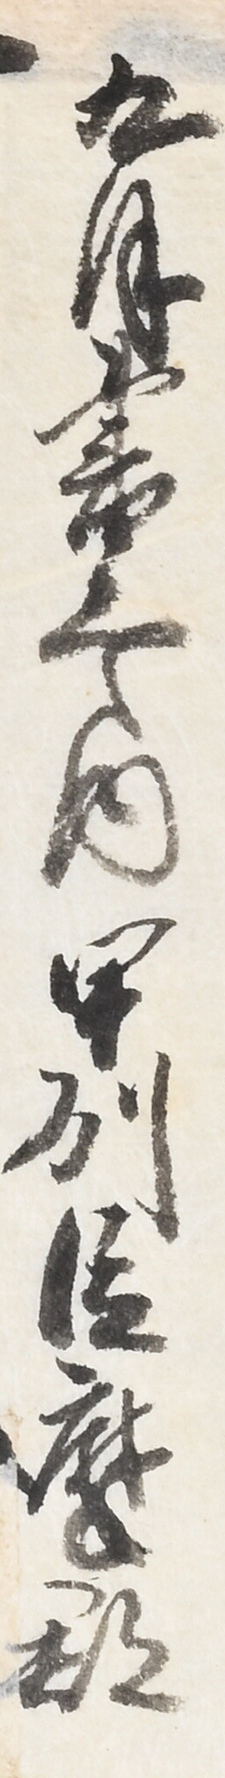九月書上之内甲州巨摩郡
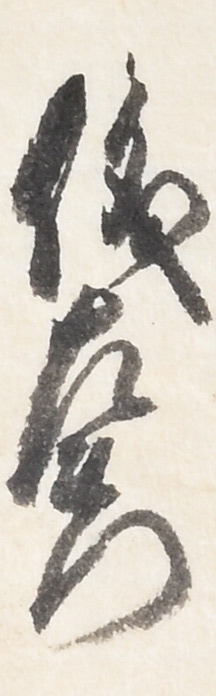儀左衛門
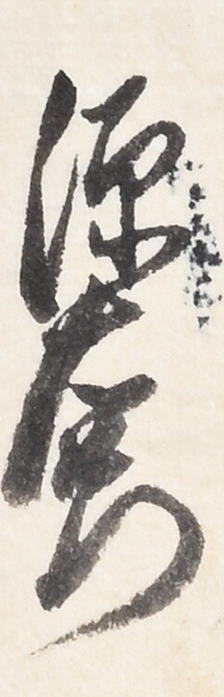源右衛門
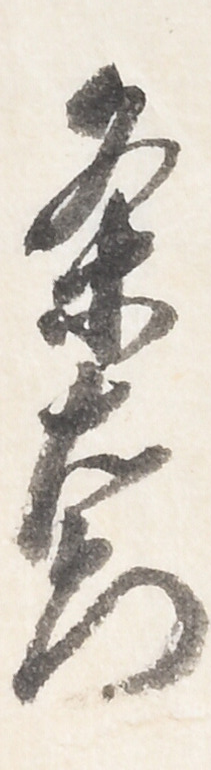源右衛門
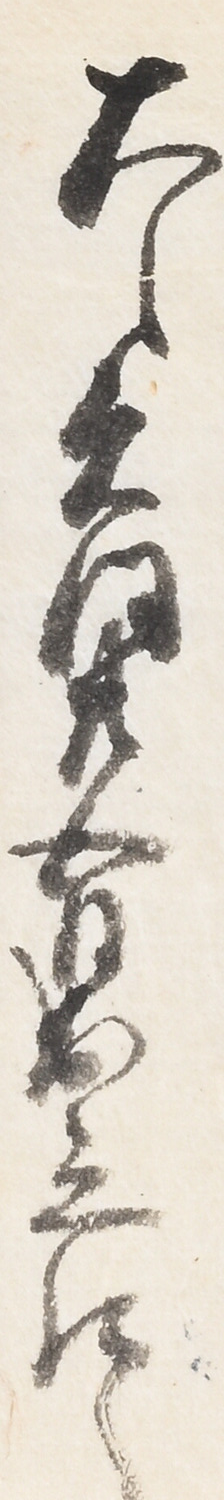右之者同廿五日出立仕候
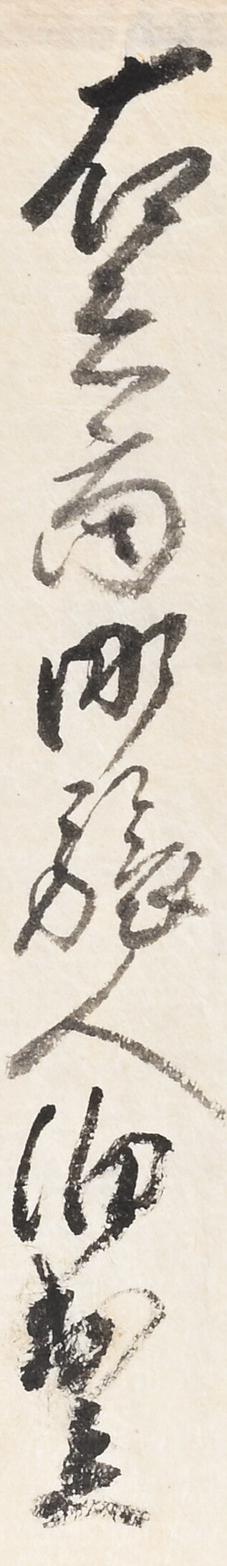右者当町旅人泊出立
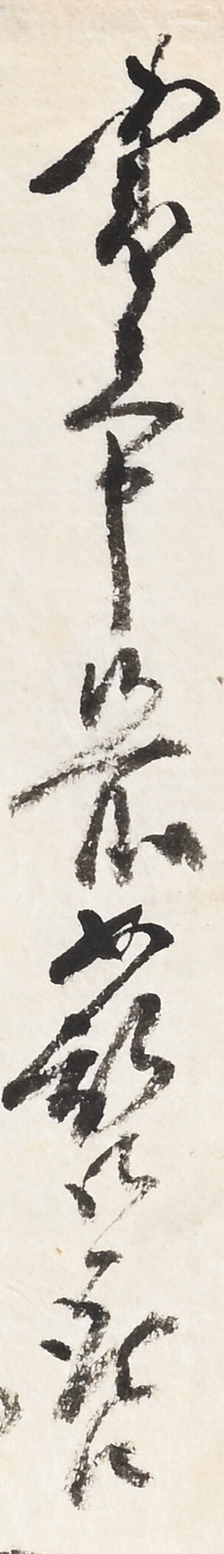書上申候所如斯御座候
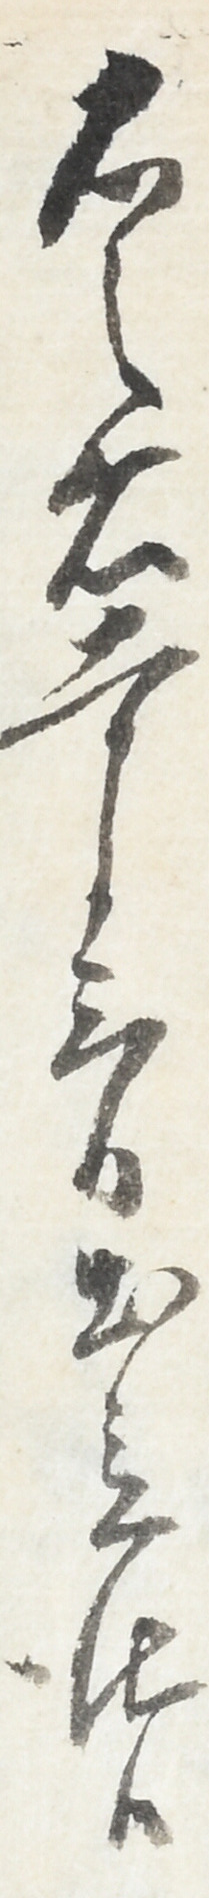右之者同廿九日出立仕候

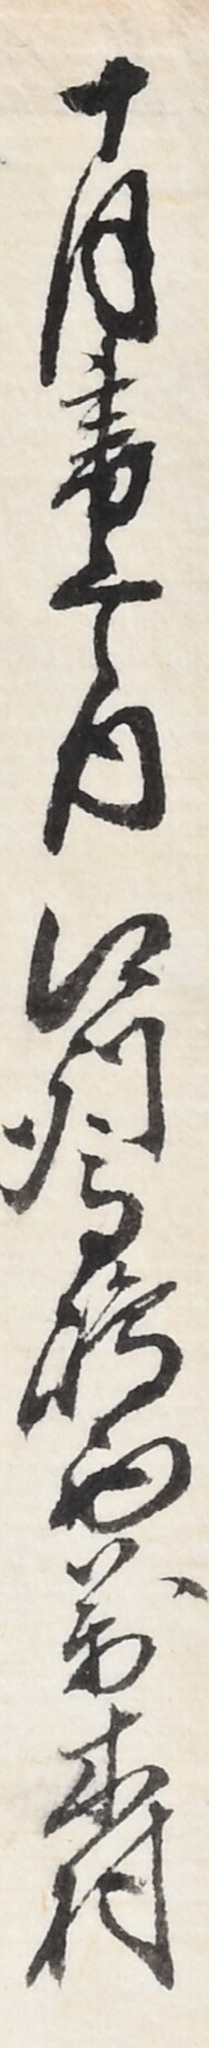十月書上之内江州高嶋西万木村
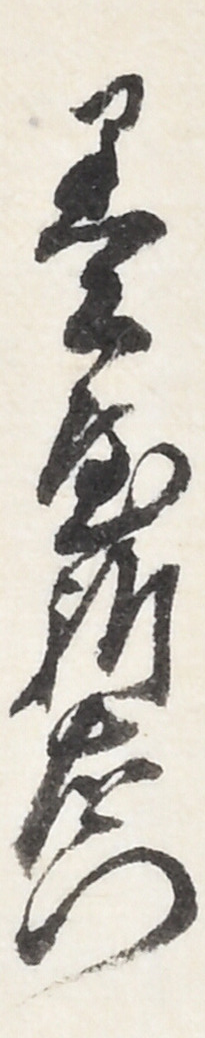一墨屋新右衛門
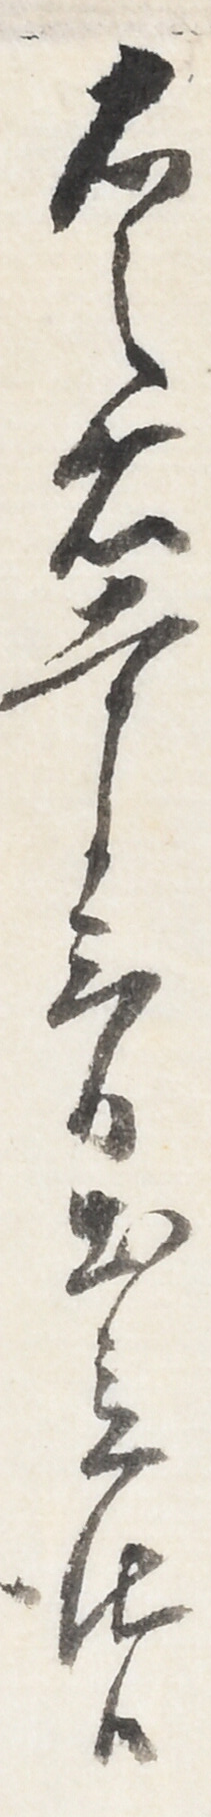右之者十一月三日出立仕候
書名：旅人泊控帳
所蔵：伊那市立高遠町図書館・合同会社AMANE
